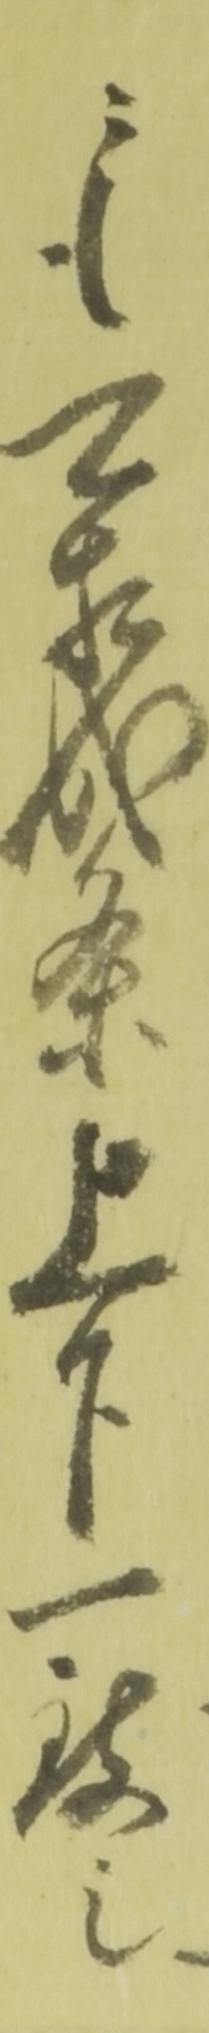ニも可相成条上下一致シ
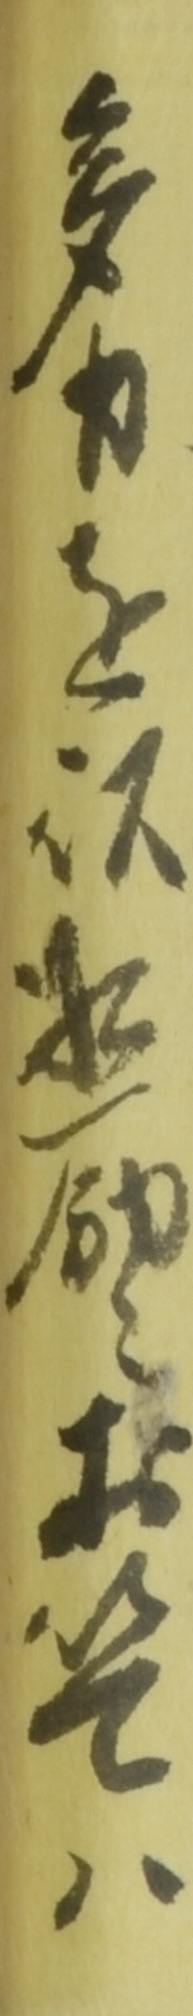多力を以壮励ニおいてハ
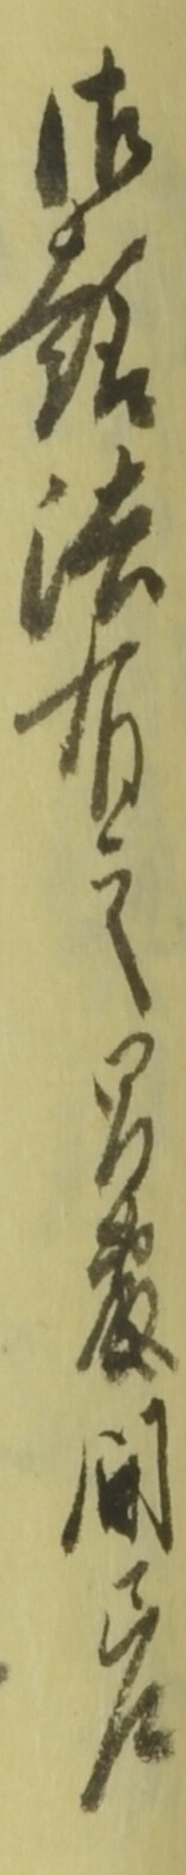御趣法有之間敷間差
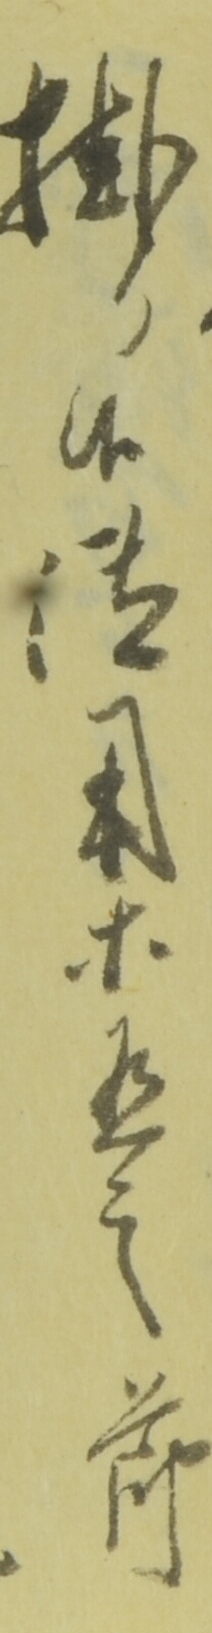掛り候御用等有之節
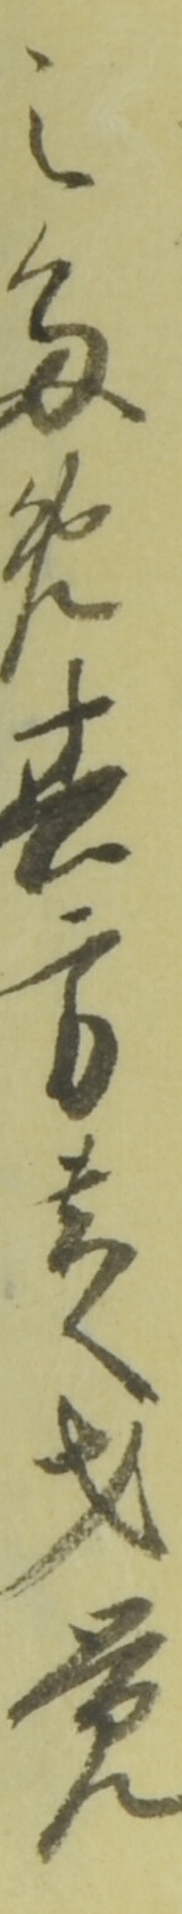之ため其方共へ才覚

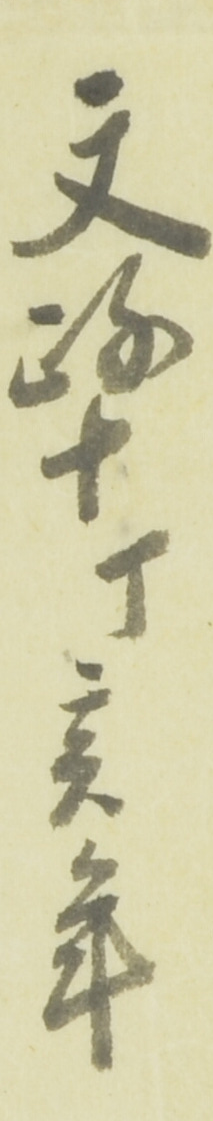文政十丁亥年
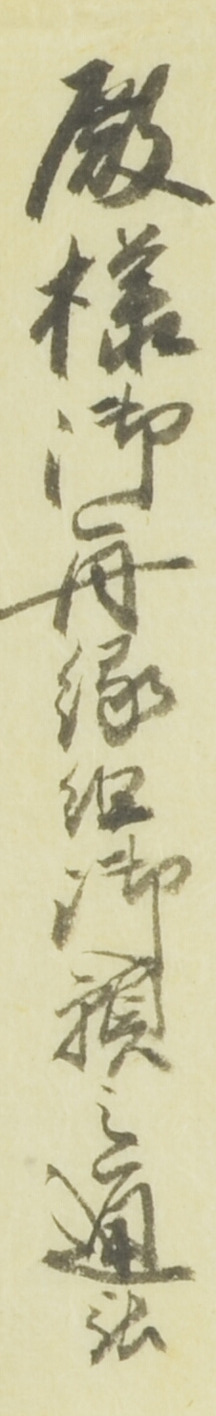殿様御再縁組御願之通被
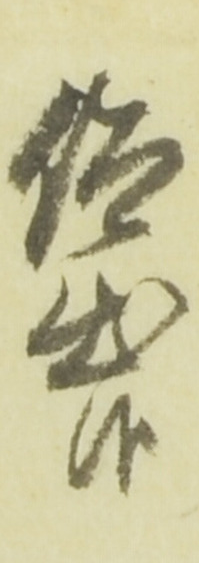仰出候
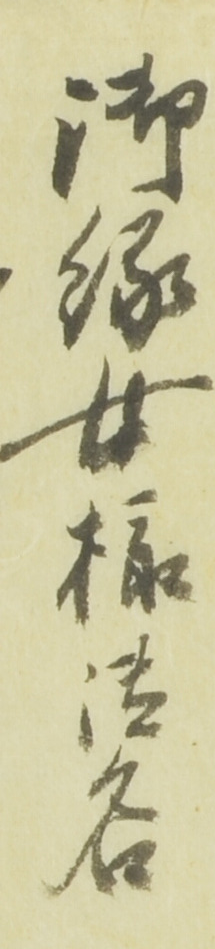御縁女様御名
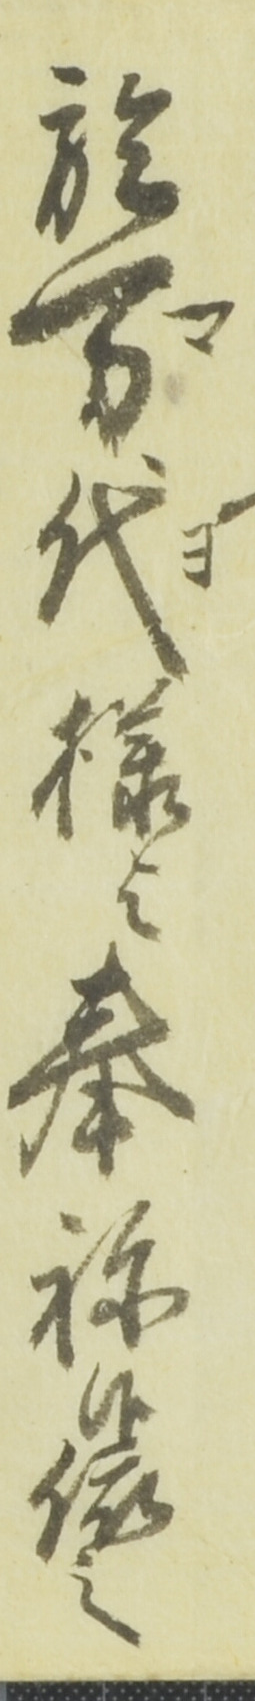於万代様と奉称候依之
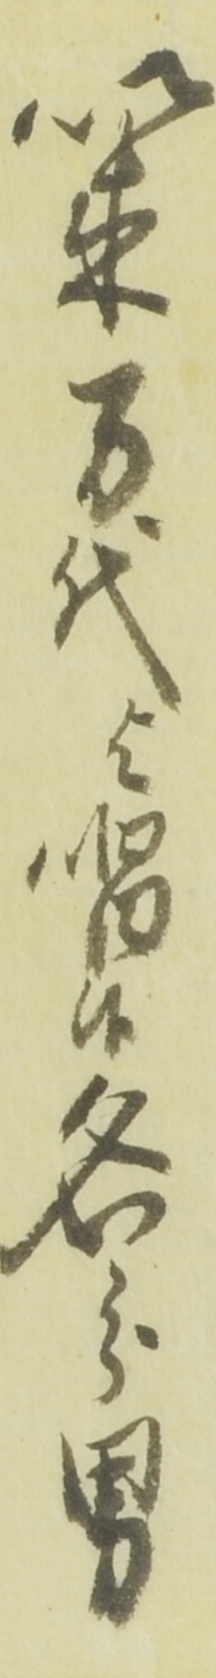以来万代と唱候名分男
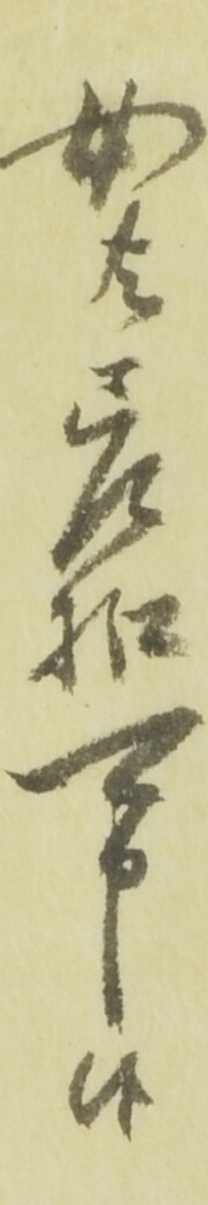女は差控可申候
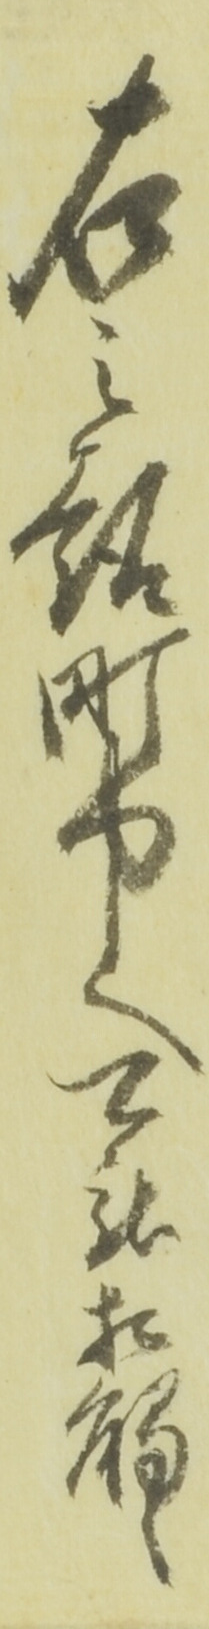右之趣町中へ可被相触候
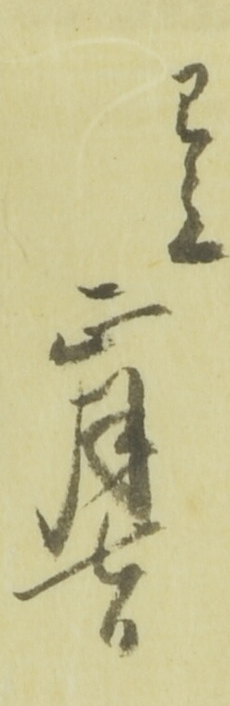正月七日
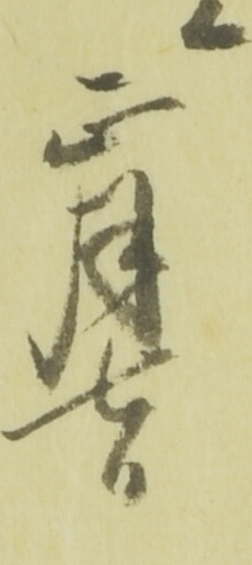正月七日
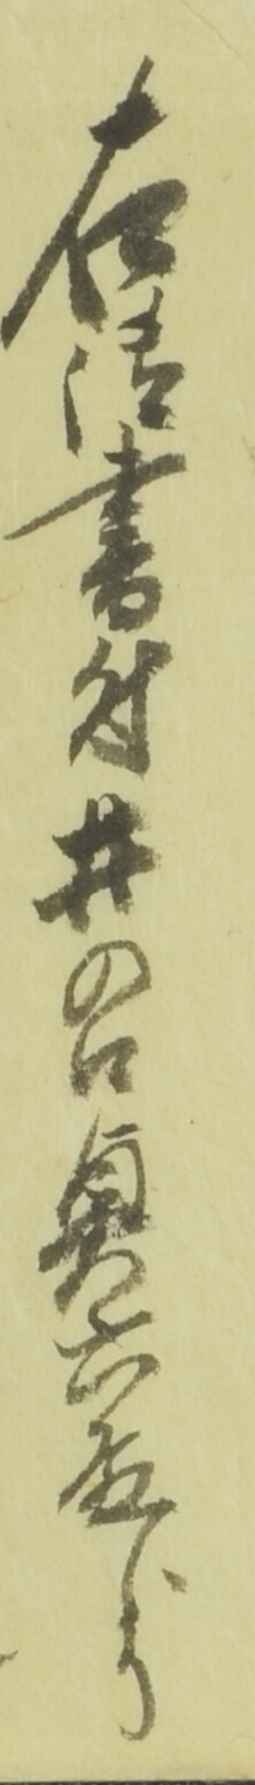右御書付井右貞六殿より
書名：御触書御書附控
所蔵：伊那市立高遠町図書館・合同会社AMANE
